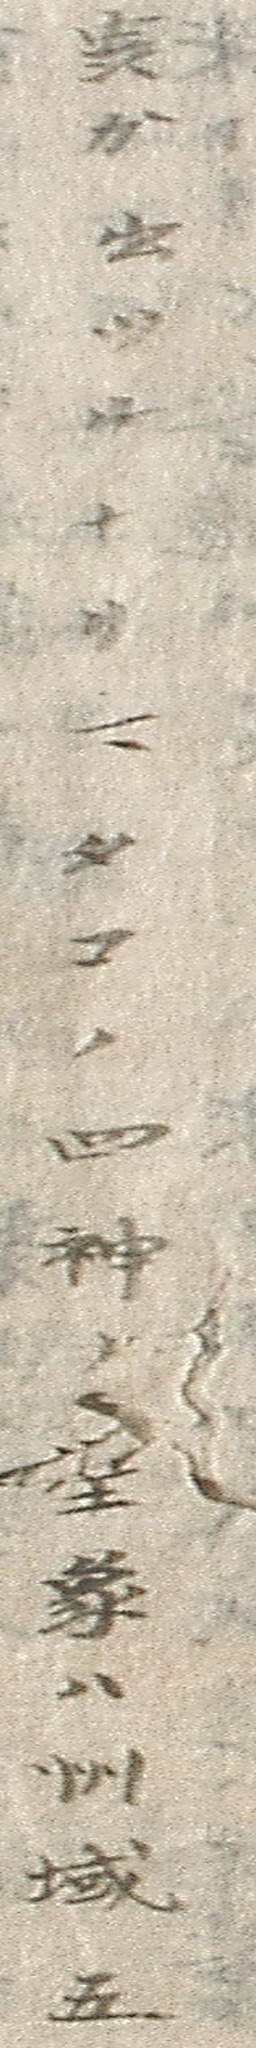蟲ガ出ツルナリマタコノ四神ノ星象ハ州域五
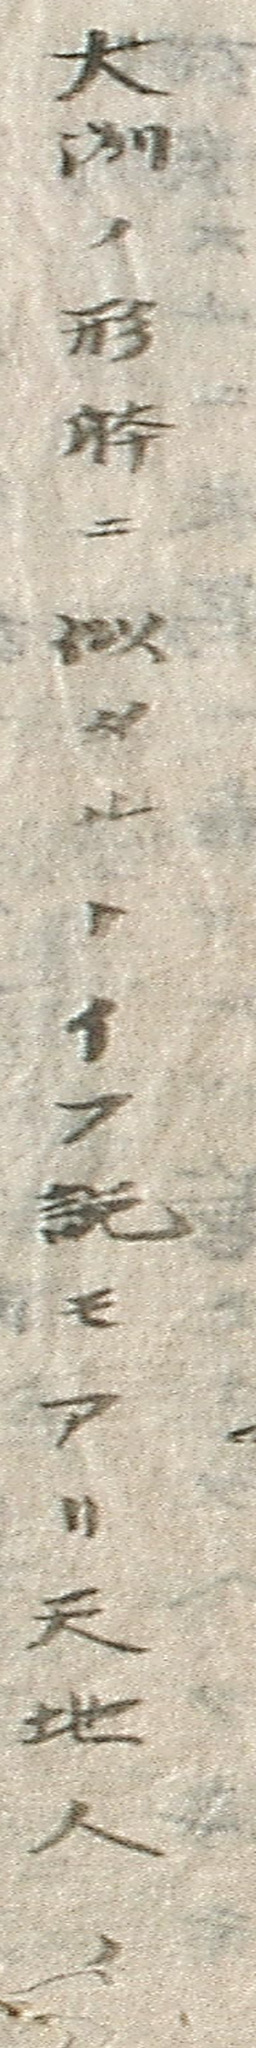大捌ノ形体ニ似タルトイフ説モアリ天地人ノ
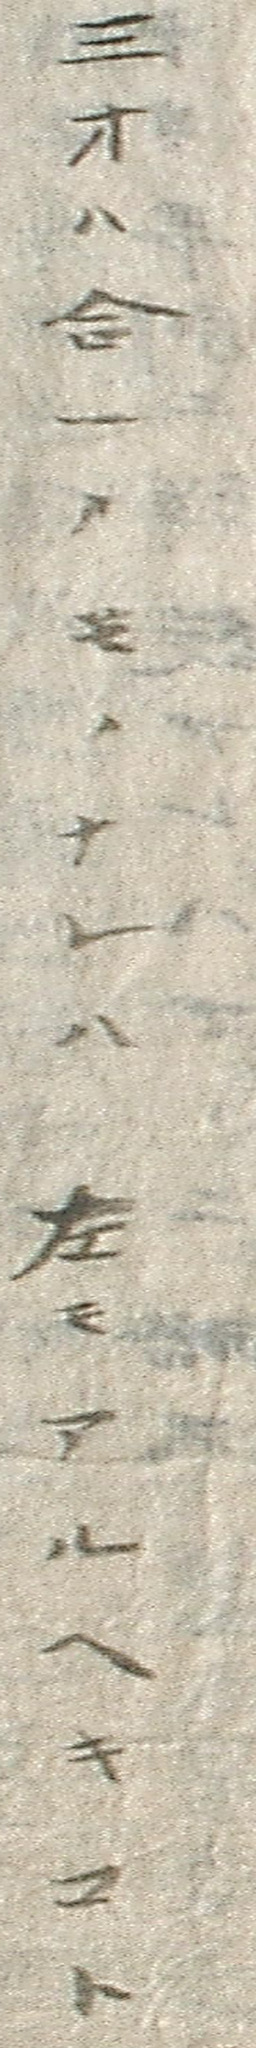三オハ合一ノモノナレハ左モアルヘキコト

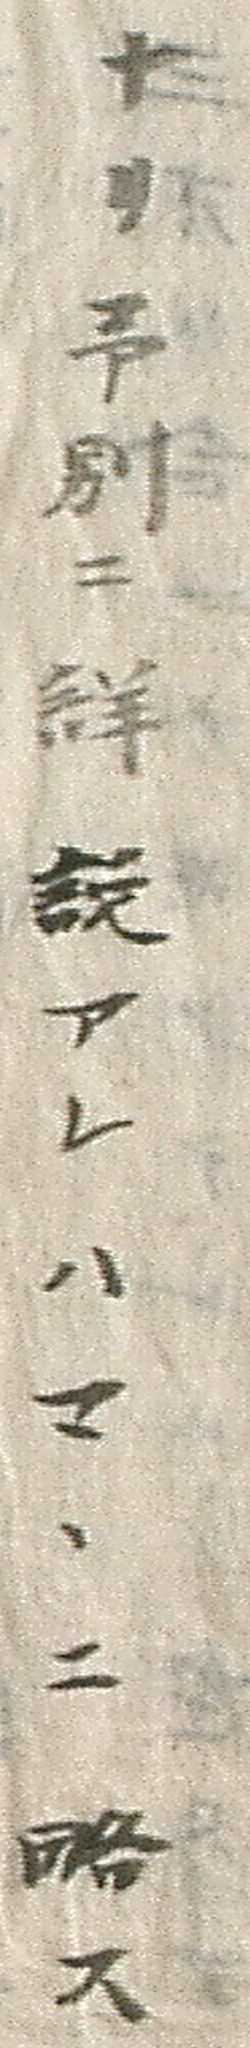ナリ予別ニ詳説アレハマヽニ略ス
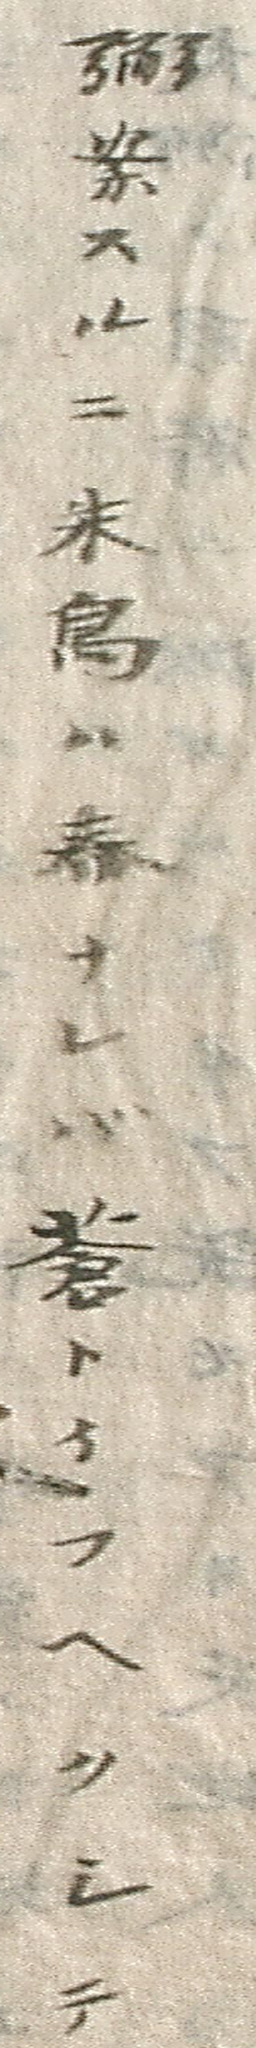弼案スルニ朱鳥ハ春ナレバ蒼トイフヘクシテ
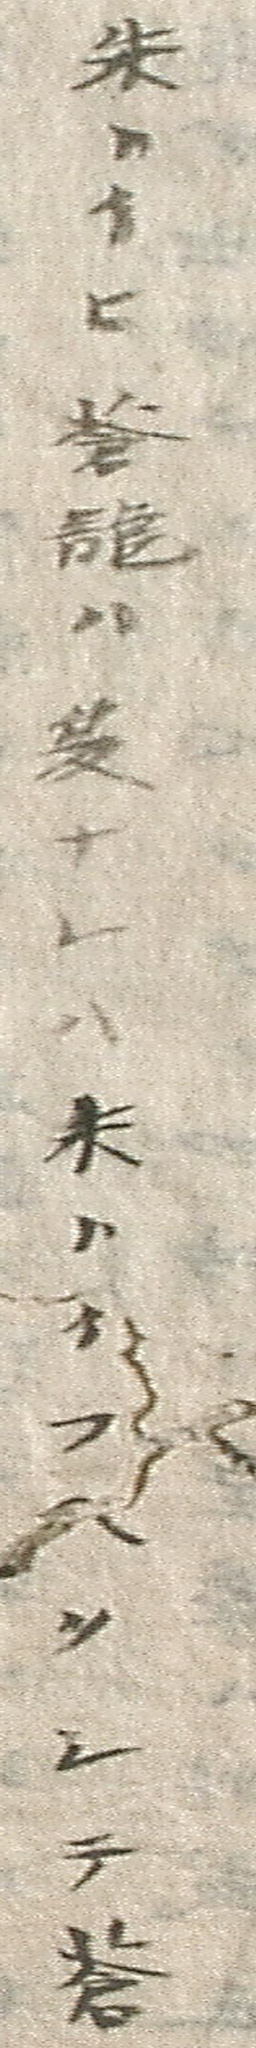朱トイヒ蒼龍ハ夏ナレハ朱トイフヘクシテ蒼
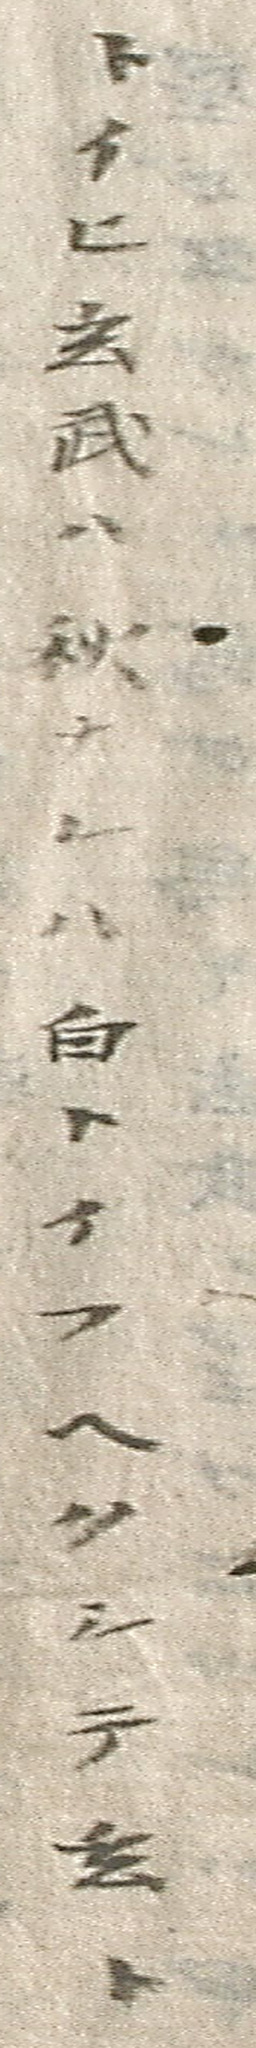トイヒ玄武ハ秋ナレハ白トイフヘクシテ玄ト
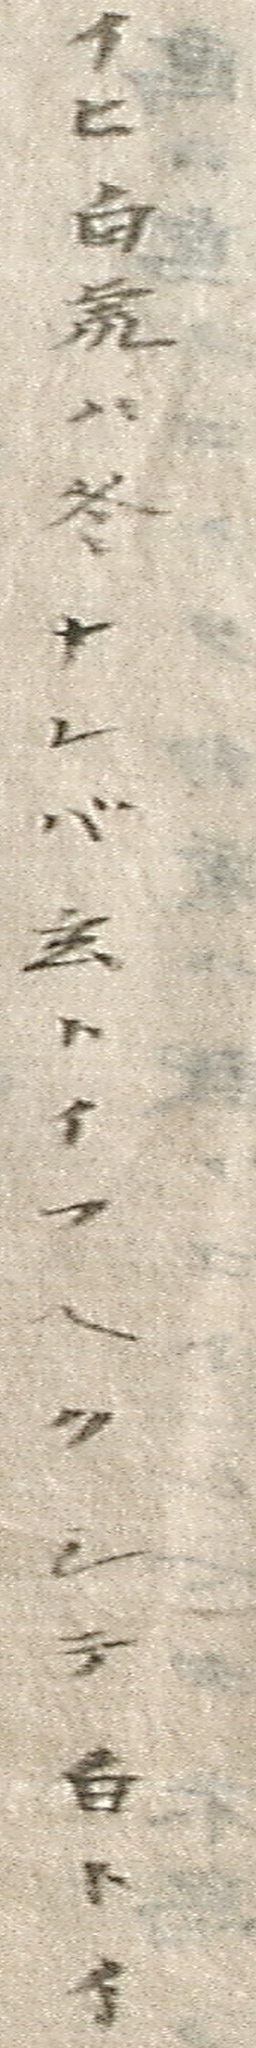イヒ白虎ハ冬ナレバ玄トイフヘクシテ白トイ
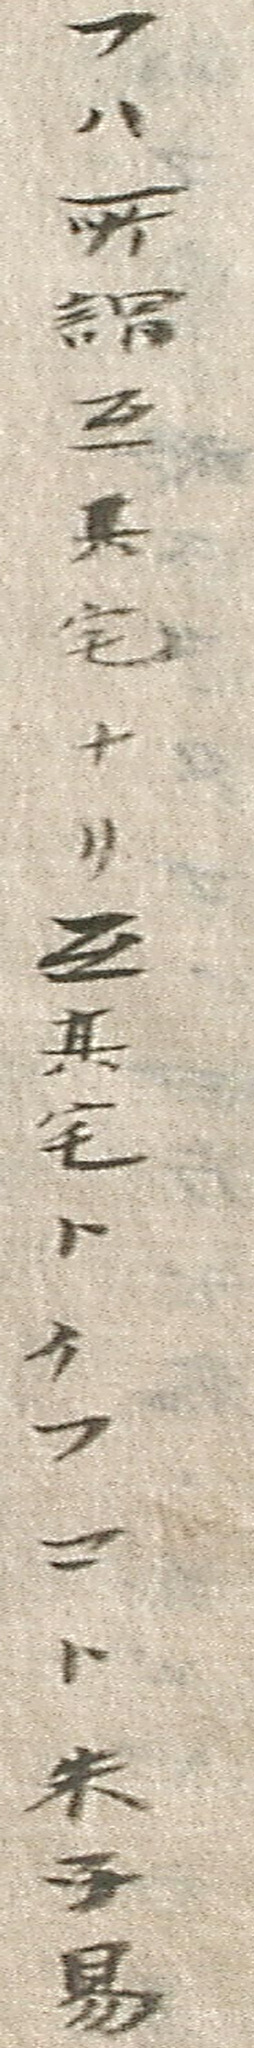フハ所謂互其宅ナリ互其宅トイフコト朱子易
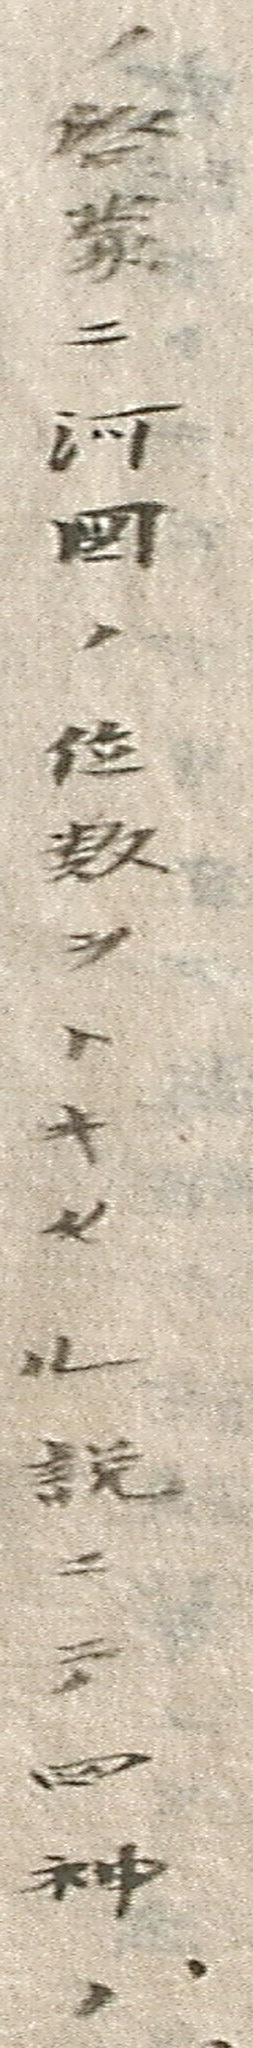ノ啓蒙ニ河図ノ位数ヲトキタル説ニテ四神ノ
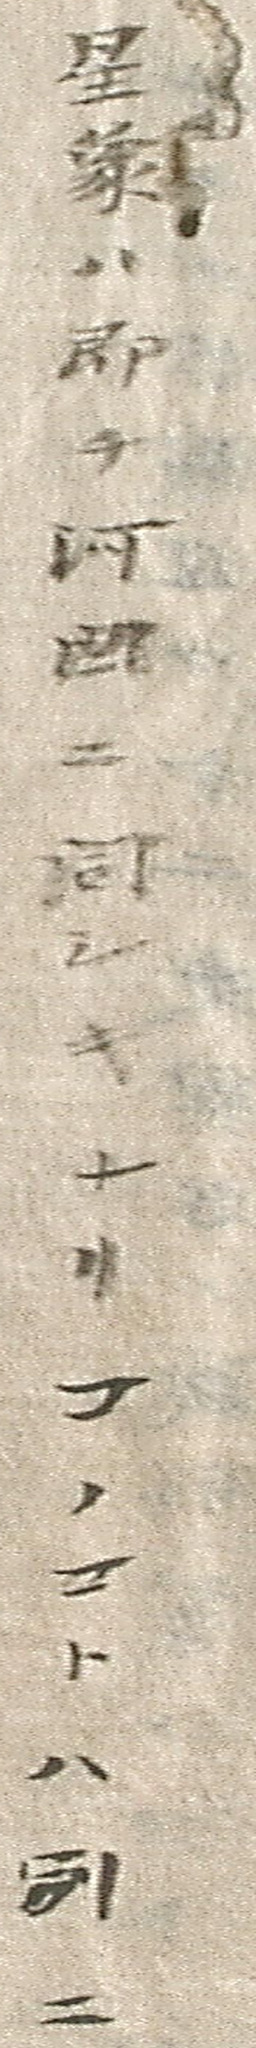星象ハ即チ河図ニ同シキナリコノコトハ別ニ
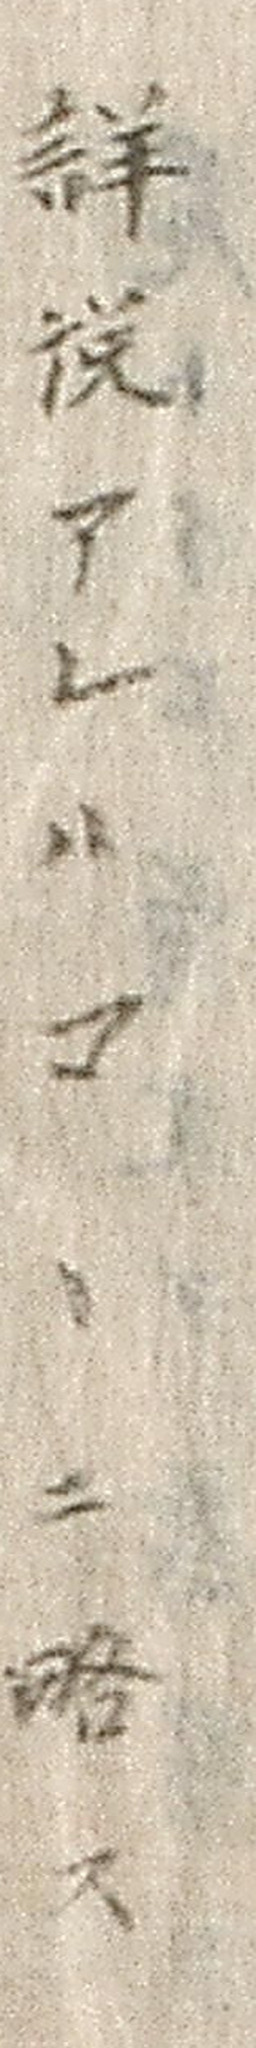詳説アレハコヽニ略ス
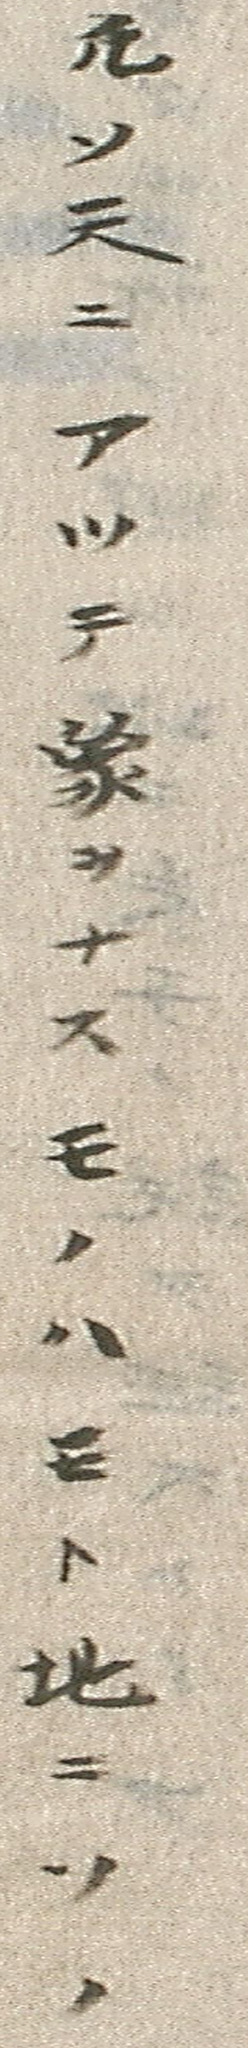凡ソ天ニアツテ象ヲナスモノハモト地ニソノ
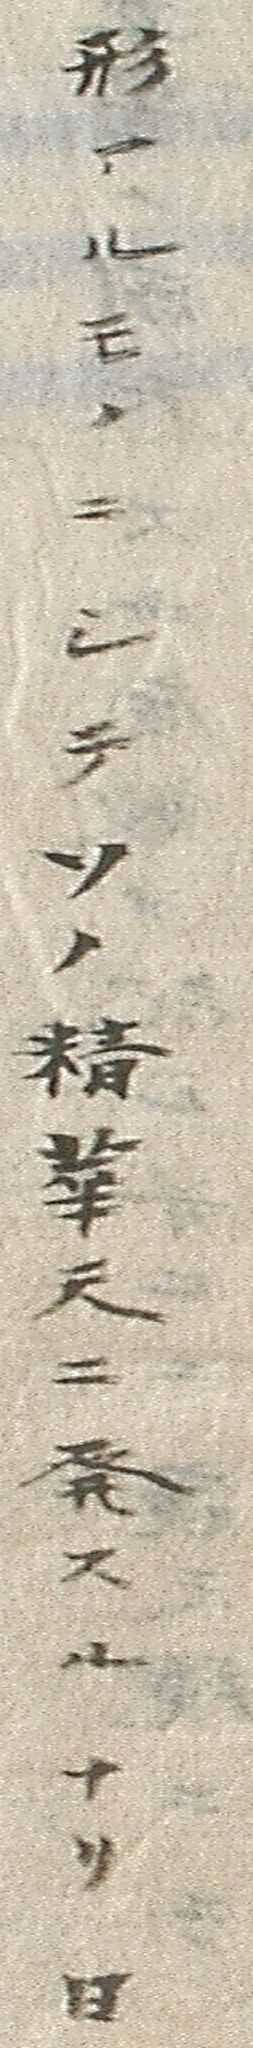形アルモノニシテソノ精華天ニ発スルナリ日
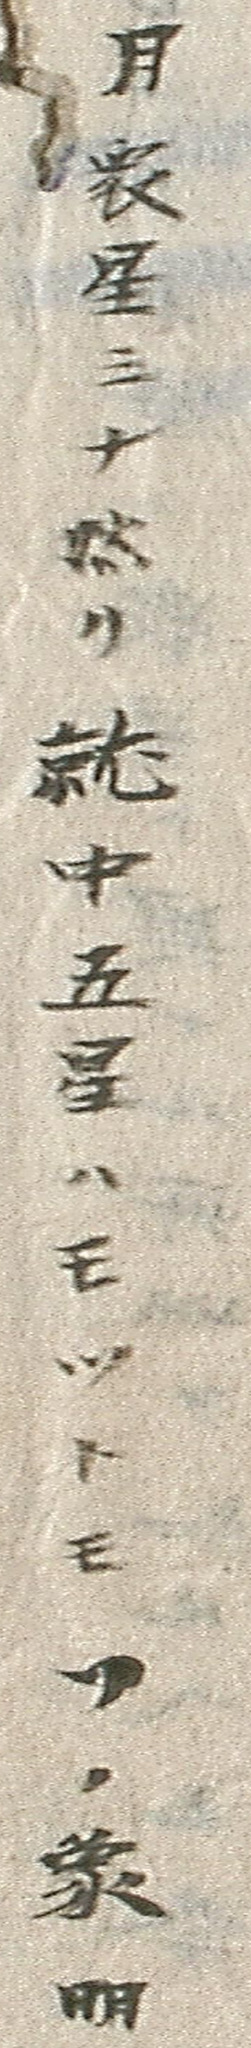月衆星ミナ然リ就中五星ハモツトモアノ象明
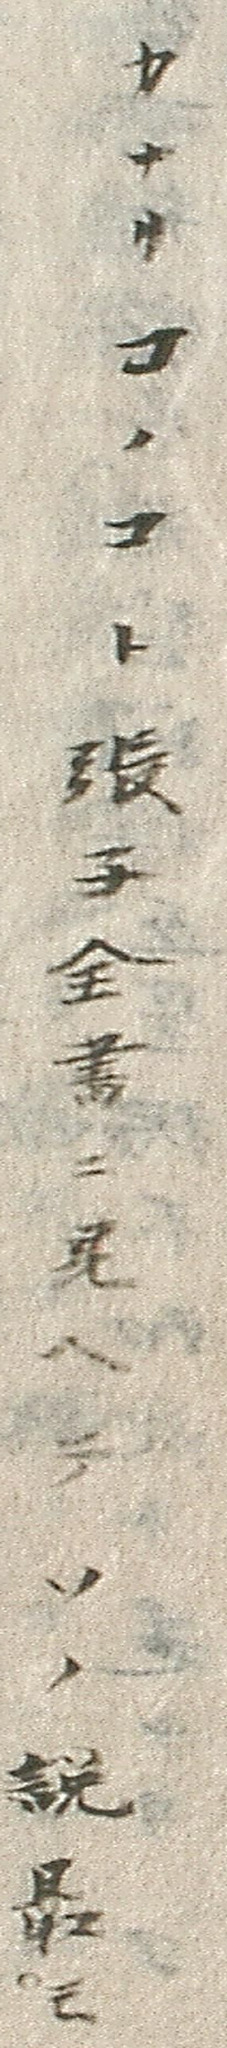カナリコノコト張子全書ニ見ヘテソノ説最モ
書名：天學便蒙図説
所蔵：東京大学地震研究所図書室 Earthquake Research Institute Library, The University of Tokyo, JAPAN
